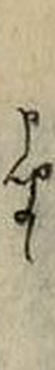申聞候
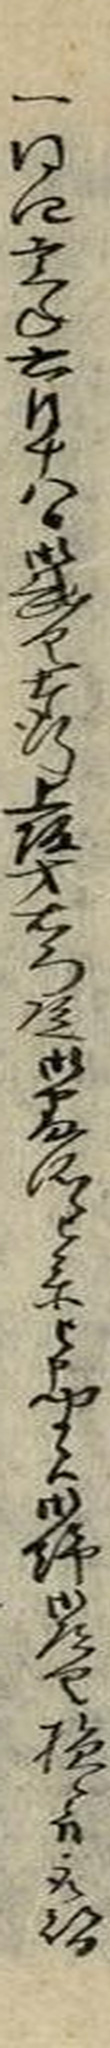一同四亥年六月十八日御武具奉行上坂才右衛門殿御番所へ被参被申聞候は御飾御道具損候に付取替
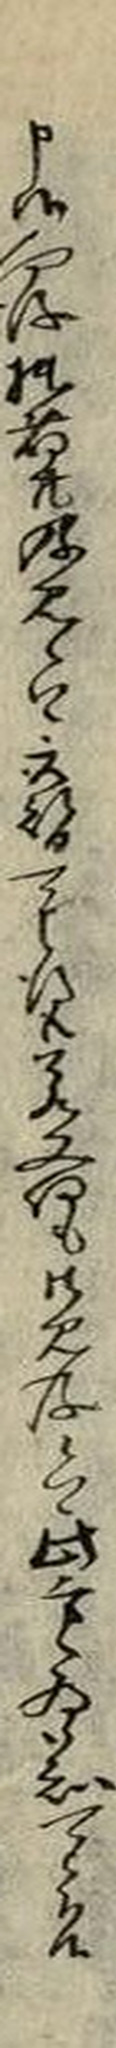申候向後拙者共及見候ハ取替可申候得共若又何も御見及候ハヽ此方へ為御知可被下候
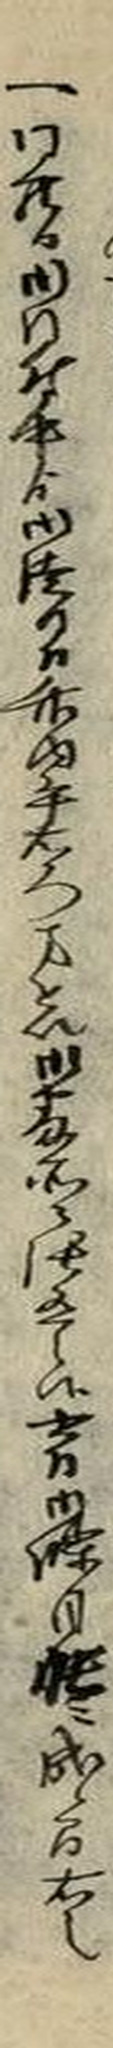一同廿日御目付中ゟ御徒目付竹内平右衛門方を以御番所へ張有之候書付御条目帳に成候間右之
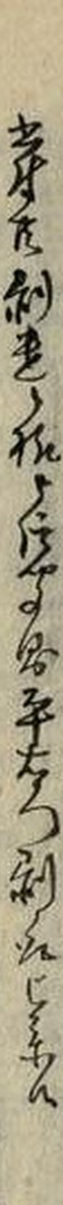書付共剥遣候様被仰聞則平右衛門剥取被参候
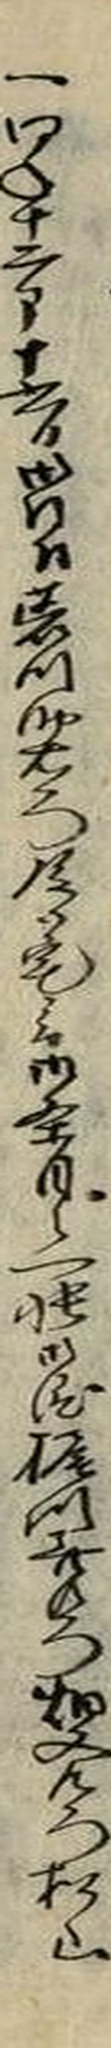一同年十二月十六日御目付荒川助右衛門殿御宅に而御条目之一帳御渡梶川喜左衛門畑又左衛門松山
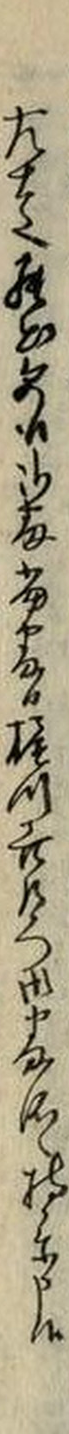左太夫罷出受取弐番当番日梶川喜左衛門御番所へ持参申候
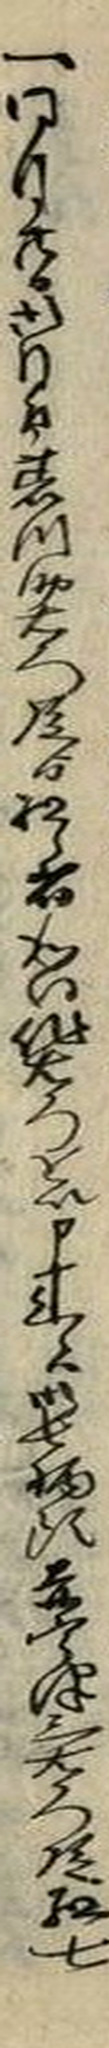一同月廿日御目付荒川助右衛門殿ゟ組之者秋田作右衛門を以申来候は御長柄頭赤宇津三右衛門殿組七
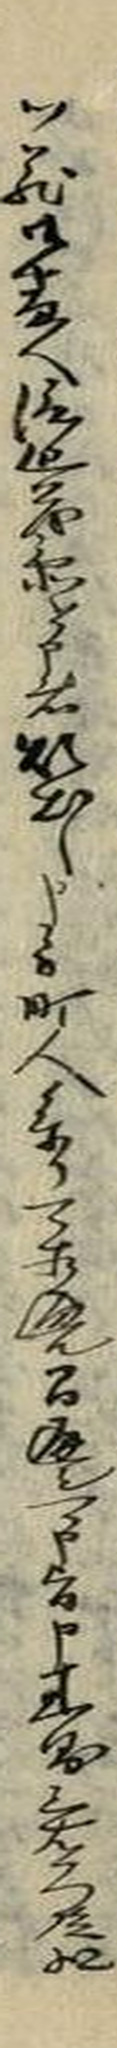ツ蔵御番人渡辺茂兵衛と申者煩出し申候ニ付町人参り可相通候間通し可申旨申来則三右衛門殿組
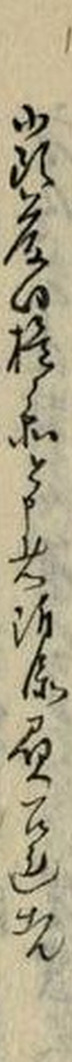小頭藤田権兵衛と申者附添負召連出候
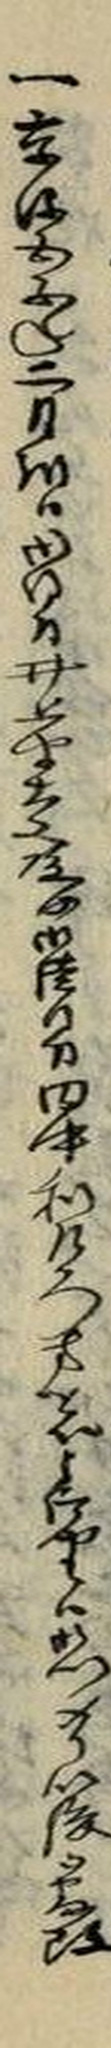一享保五子年二月朔日御目付井上半太夫殿ゟ御徒目付田中利左衛門方を以被仰聞候は御門〆り以後御番改
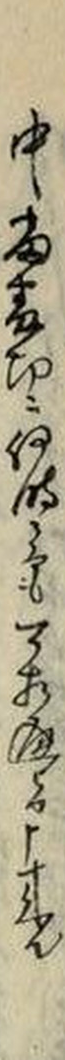中当番切に何時に而も可相通旨申来ル
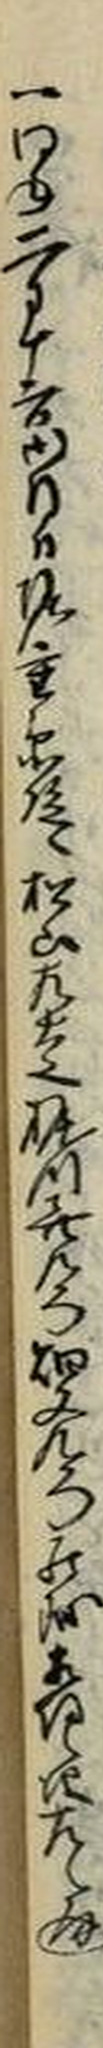一同年二月十二日御目付堀重兵衛殿へ松山左太夫梶川喜左衛門畑又左衛門罷越相伺候儀左之通
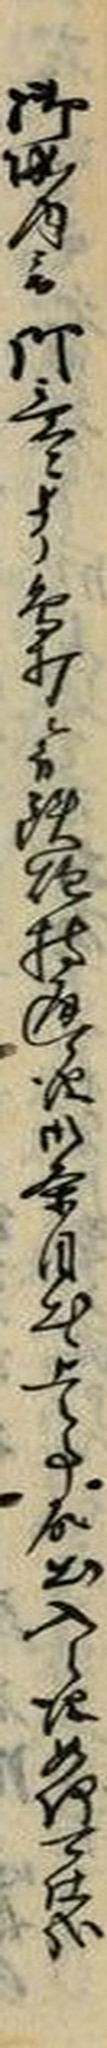御城内に而御意により鳥打候ニ付鉄砲持通候儀御条目出候上之事故出入之儀如何可仕哉
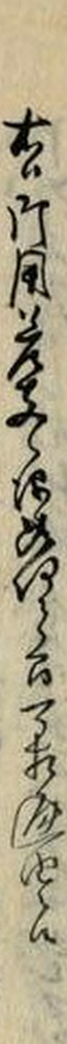右は御用差支候儀如何候間可相通由に候
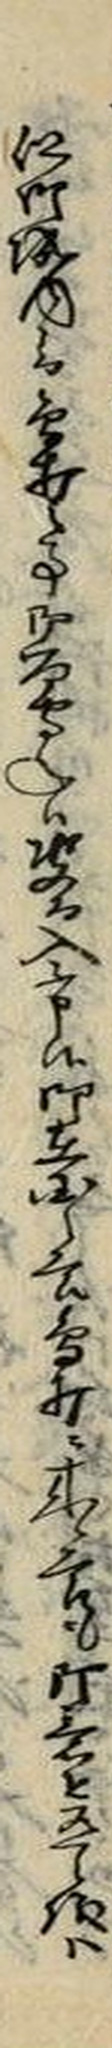但御城内ニ而鳥打之事御留守年ハ決而入不申候御在国之節鳥打ニ来候節も御意を有之儀ハ
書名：御門御櫓之部
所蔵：福井県文書館 Fukui Prefectural Archives
